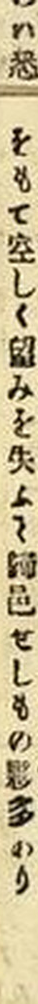をもて空しく望みを失ふて帰邑せしもの夥多あり
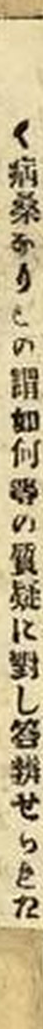く病桑なりとの謂如何等の質疑に対し答弁せられた

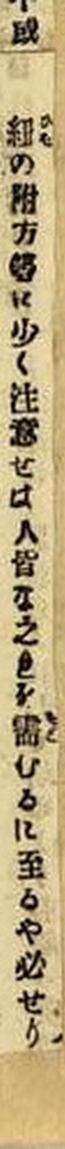紐の附方等に少く注意せは人皆な之れを需むるに至るや必せり
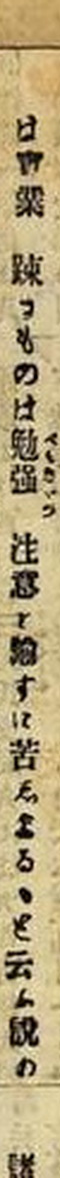は実業疎きものは勉強注意を諭すに苦しまるゝと云ふ説あ
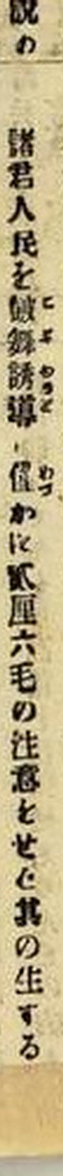諸君人民を鼓舞誘導僅かに弐厘六毛の注意をせば其の生する
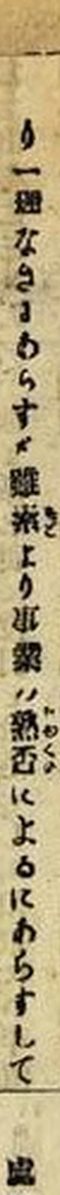り一理なきにあらすと雖索より事業の熟否によるにあらすして
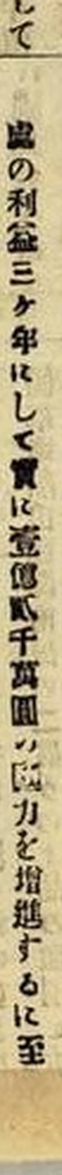処の利益三ケ年にして実に壱億弐千万円の国力を増進するに至
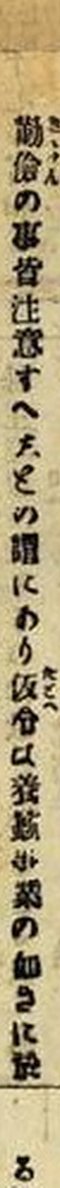勤倹の事皆注意すへしとの謂にあり仮令は養蚕事業の如きに於
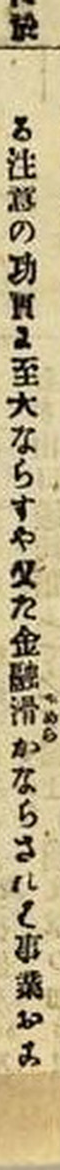る注意の功実に至大ならすや又た金融滑かならされは事業おこ
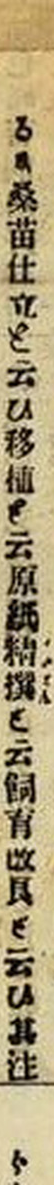るも桑苗仕立と云ひ移植と云原紙精撰と云飼育改良と云ひ其注
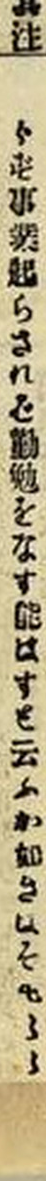らす事業起らされば勤勉をなす能はすと云ふか如きはそもゝゝ
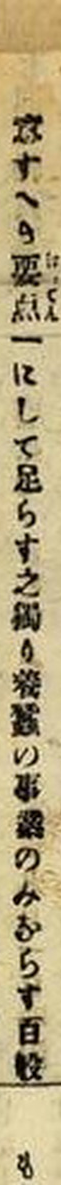意すへき要点一にして足らす之独り養蚕の事業のみならす百般
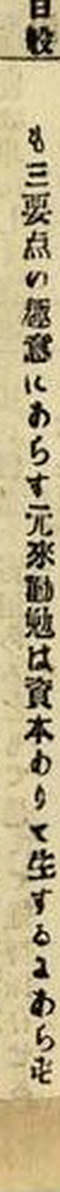も三要点の趣意にあらす元来勤勉は資本ありて生するにあらす
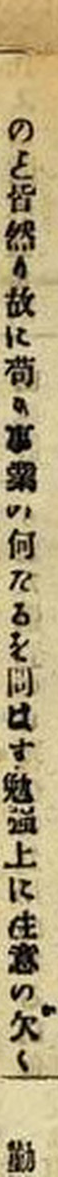のこと皆然り故に苟も事業の何たるを問はす勉強上に注意の欠く
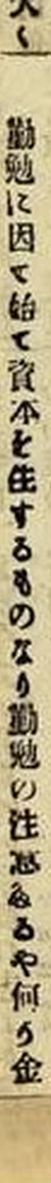勤勉に因て始て資本を生するものなり勤勉の注意たるや何そ金
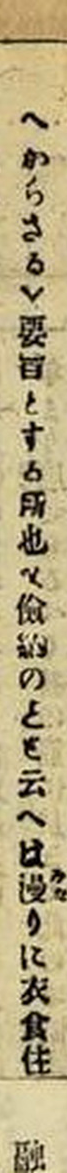へからさるを要旨とする謂也倹納のことを云へは漫りに衣食住
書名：温古集 五巻
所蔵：福井県文書館 Fukui Prefectural Archives
